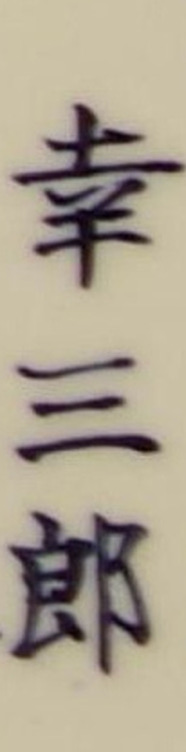幸三郎
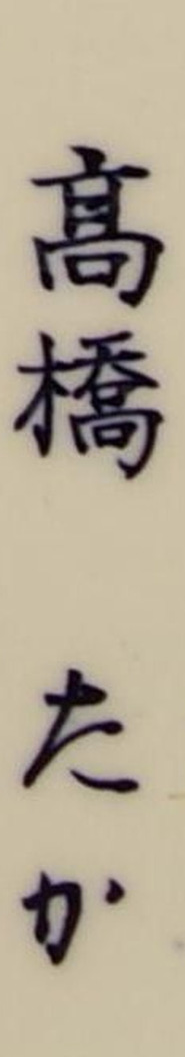高橋たか
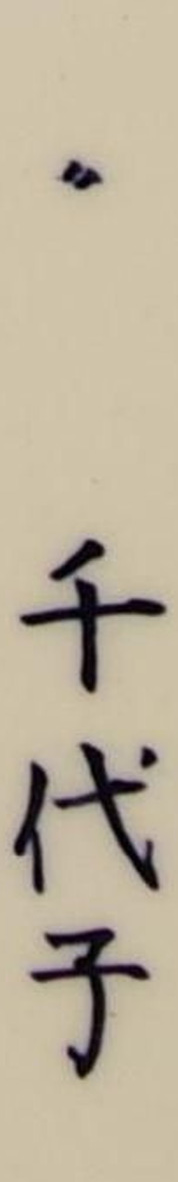千代子
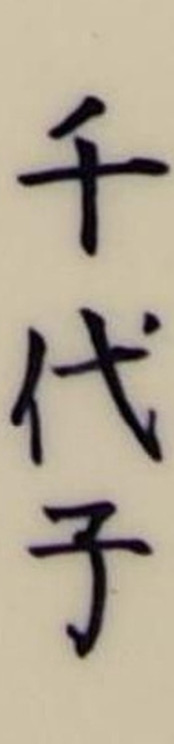千代子
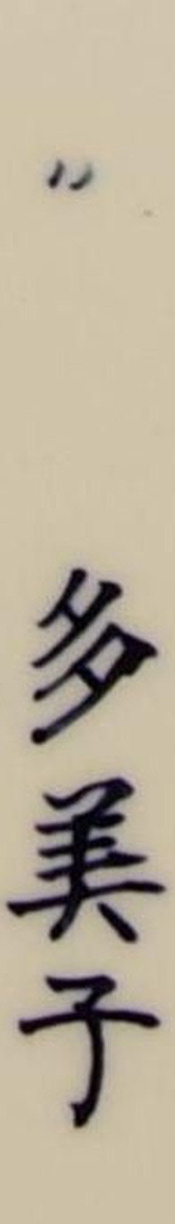多美子
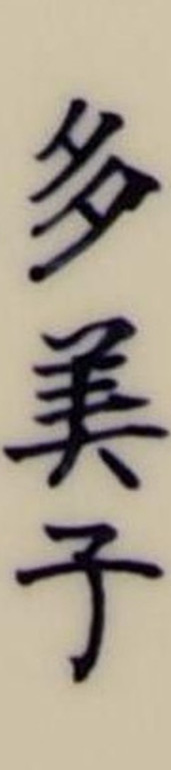多美子
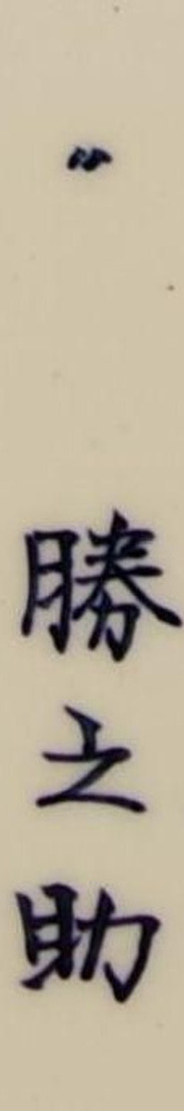勝之助
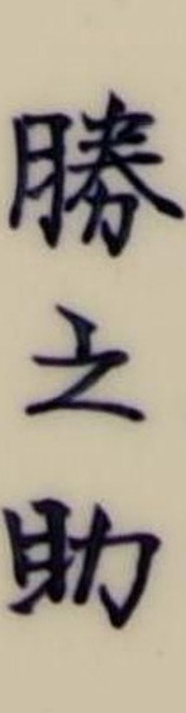勝之助
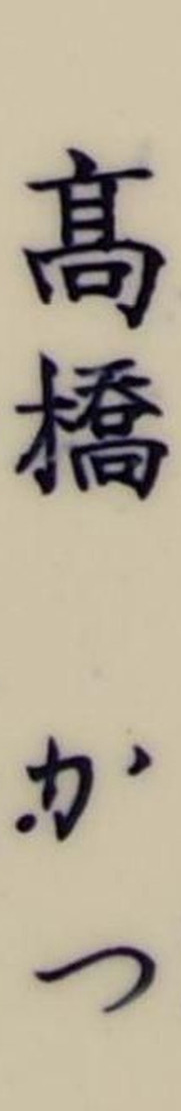高橋かつ
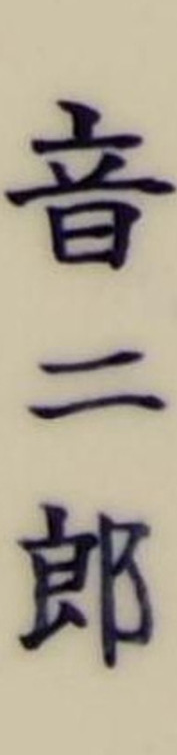音二郎
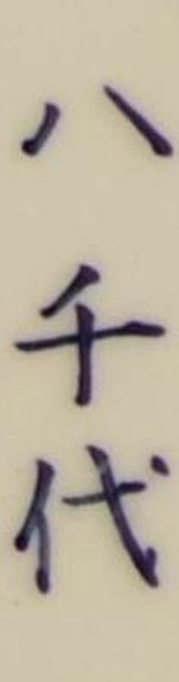八千代

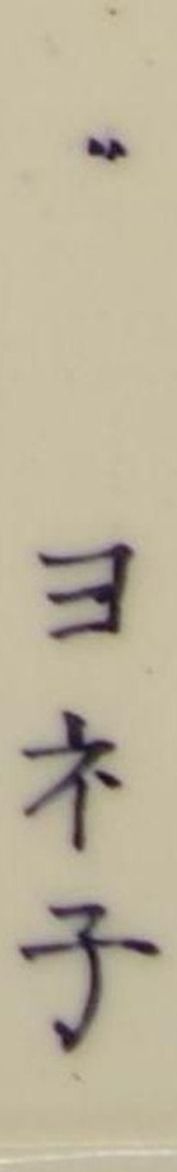ヨネ子
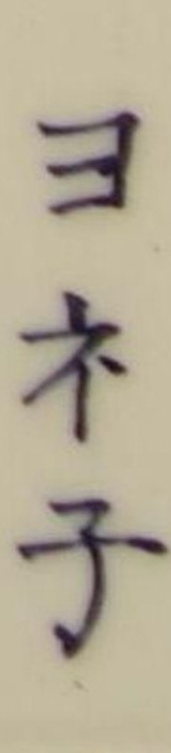ヨネ子
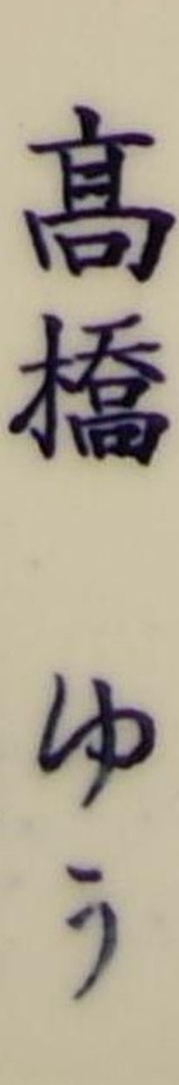高橋ゆう
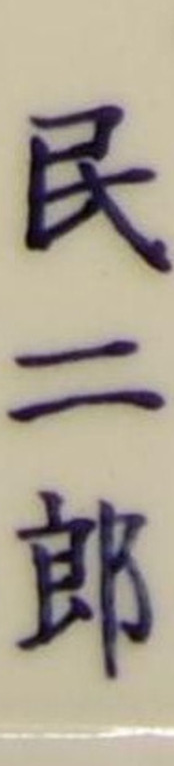民二郎
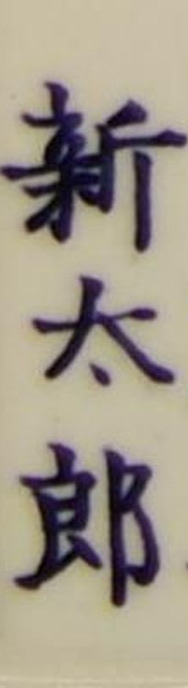新太郎
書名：A~D
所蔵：koyasan kongobuji
